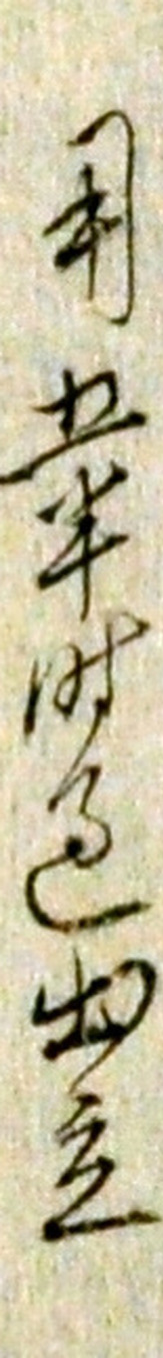用五半時過出立
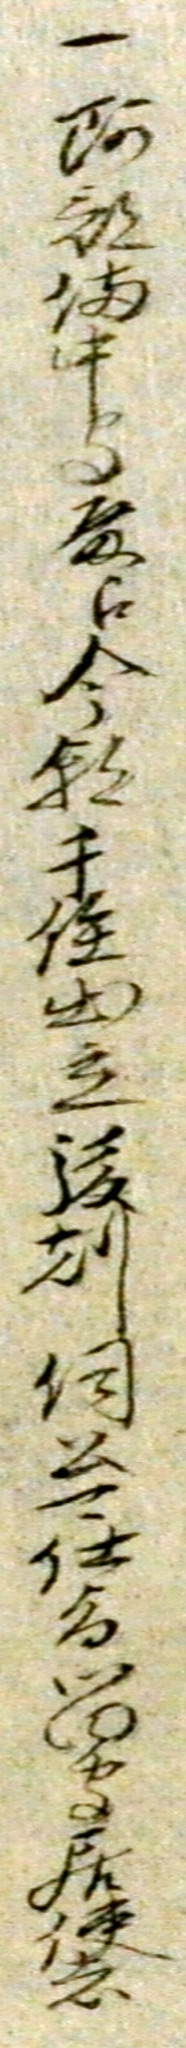一阿部備中守殿江今朝千住出立後刻伺候公可仕旨留守居使者
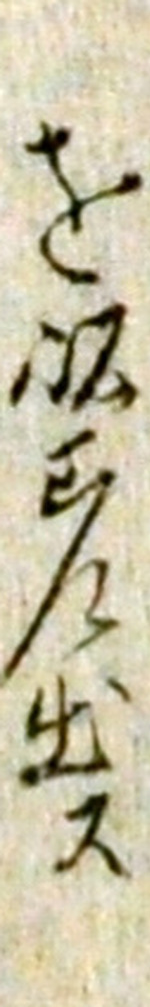を以差出ㇲ
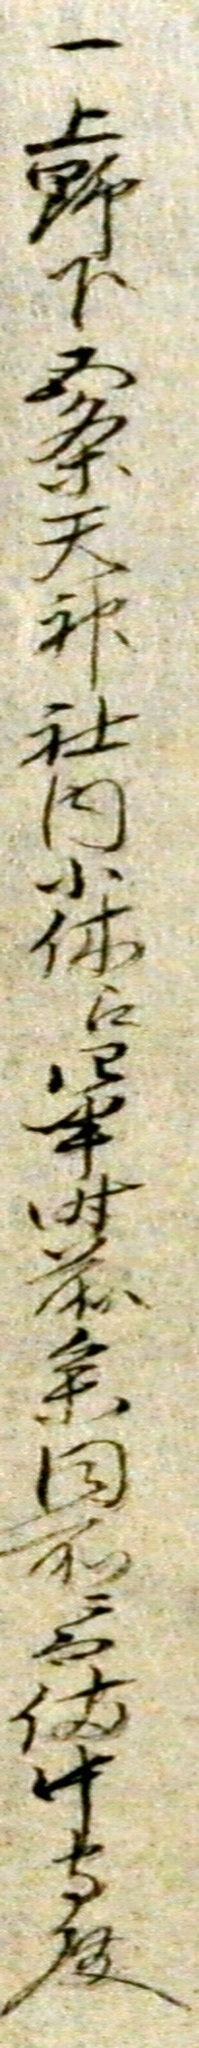一上野下五条天神社内小休江四半時前参目前二而備中守殿
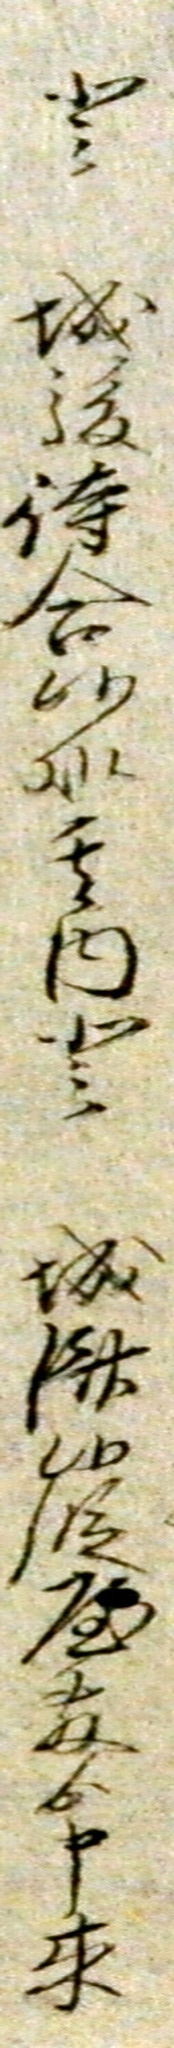登城後待合候処其内登城済候段屋敷ゟ申来
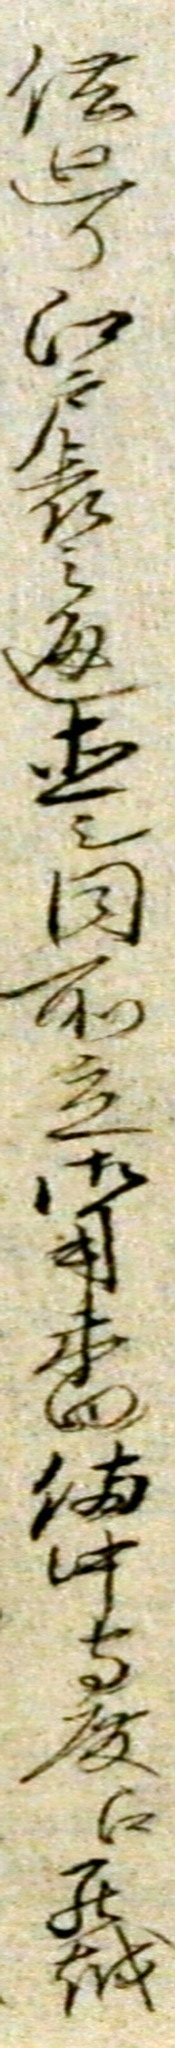供廻り江戸表之通直シ同所立御用番備中守殿江罷越
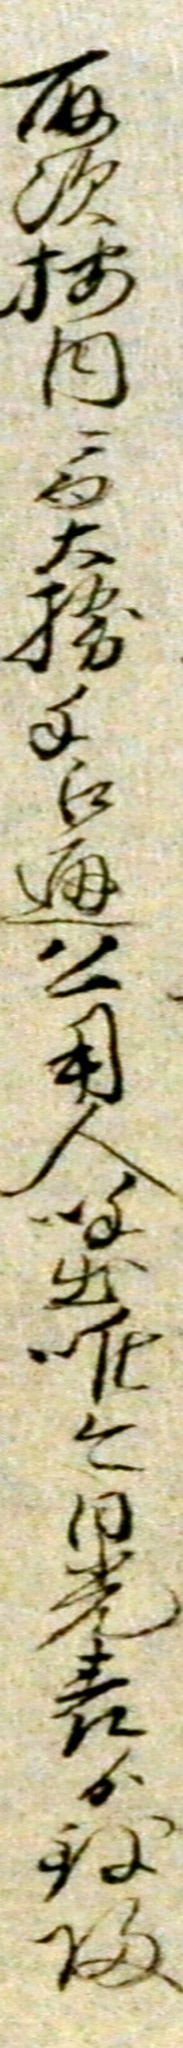取次按内ニ而大勝手江通公用人呼出唯今日光ゟ致帰
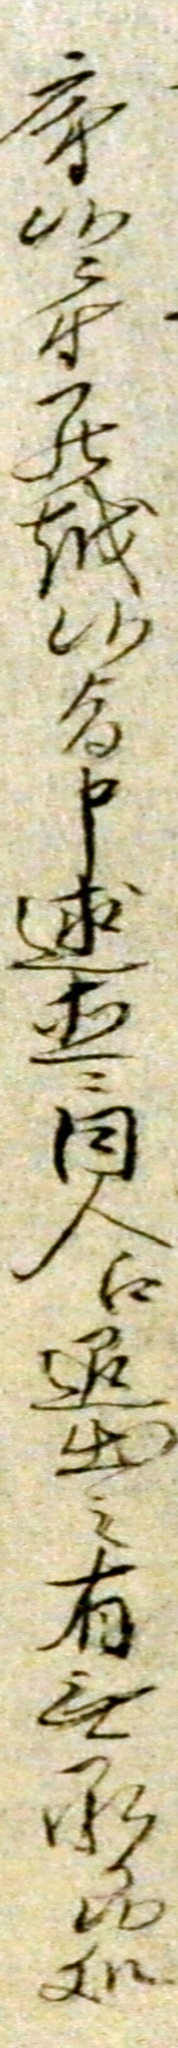府候二付罷越候旨申述直ニ同人江退出之有無承り候処
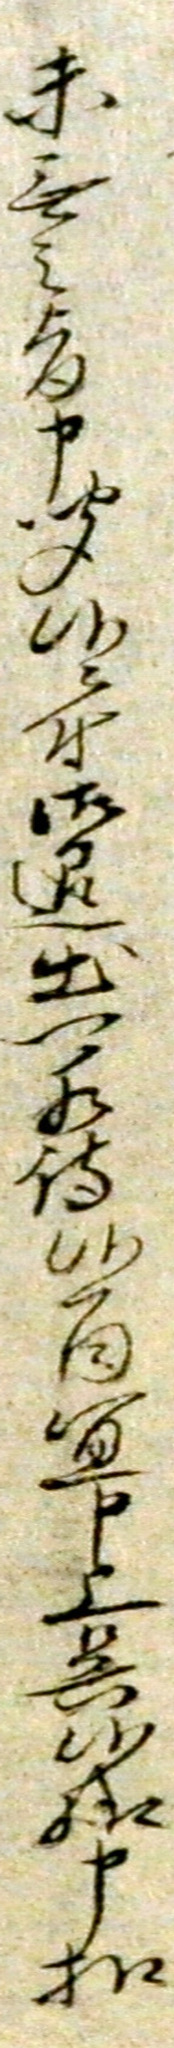未無之旨申聞候二付御退出可相待候間宜申上呉候様申扣
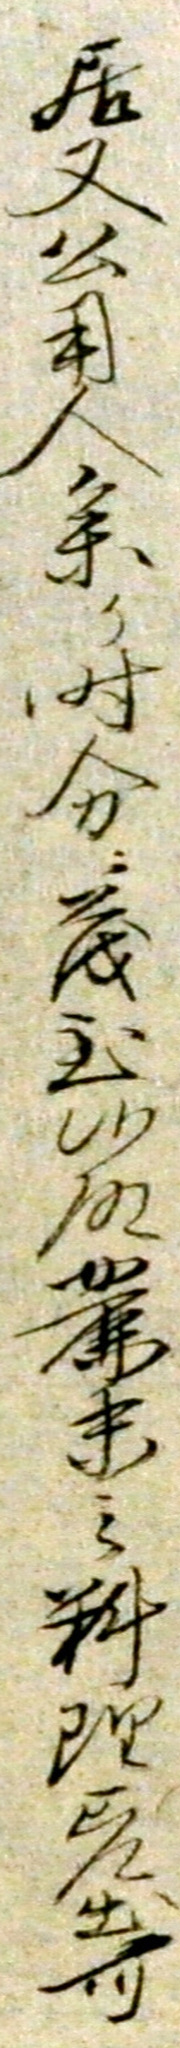居又公用人参り時分ニ茂至候故簾末之料理差出可
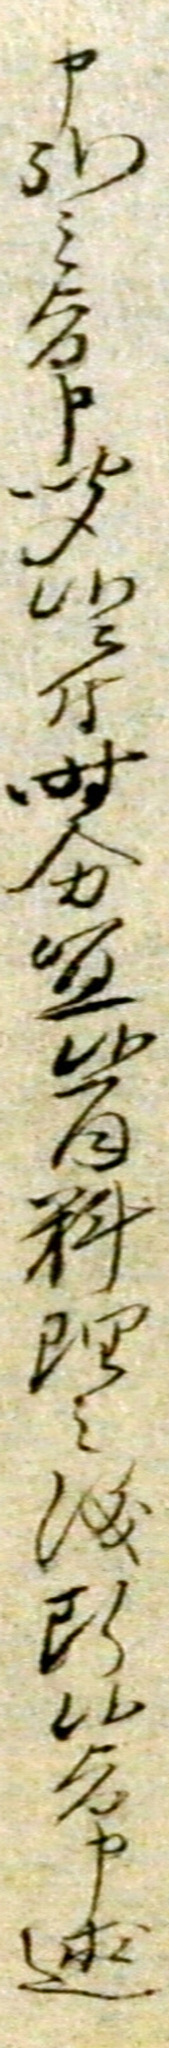申哉之旨申候ニ付時分宜候料理之儀断候旨申述
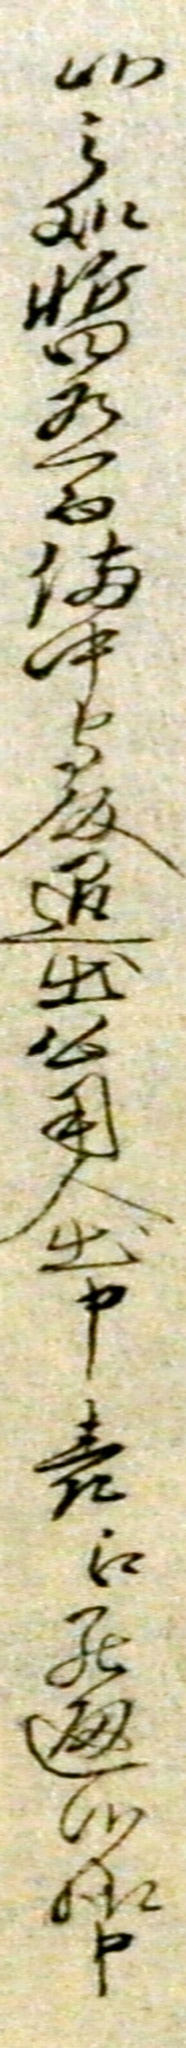候之処暫有而備中守殿退出公用人出申表江罷通候様申
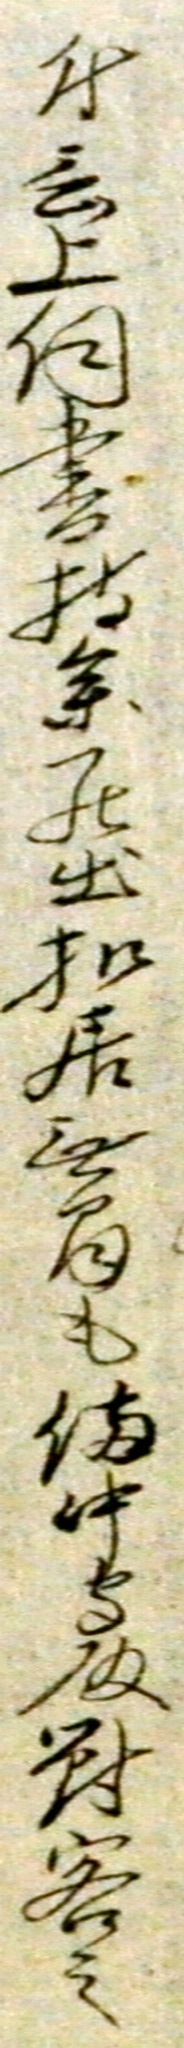付言上伺書持参罷出控居無間も備中守殿対客之
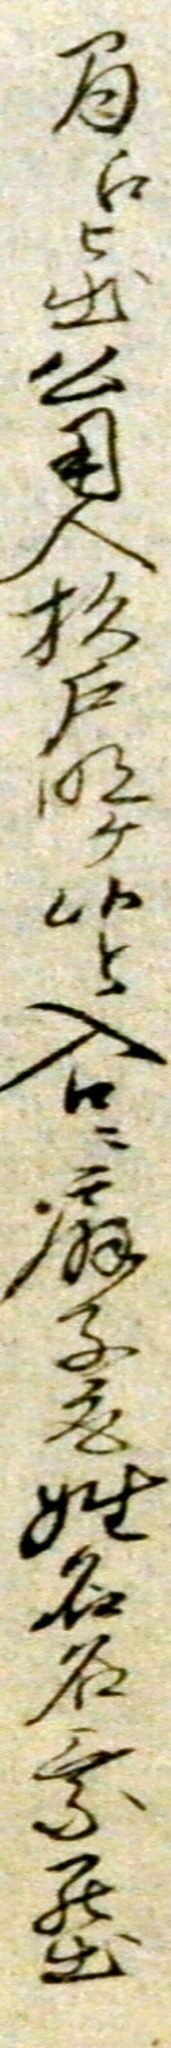間江ヒ出公用人杉戸明ケ候と入口扇子取姓名名乗罷出
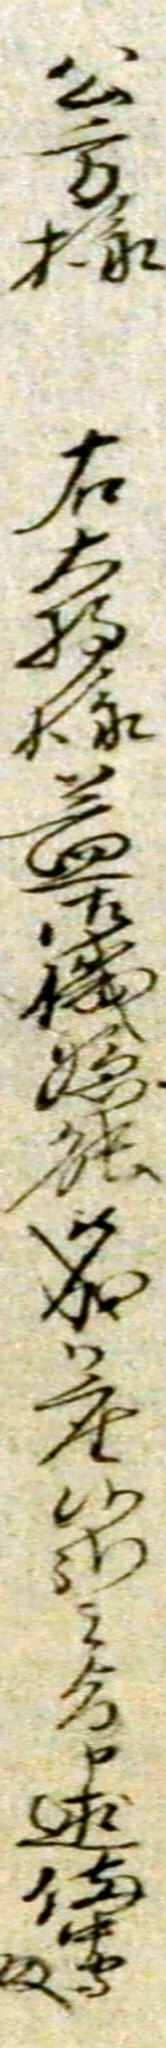公方様右大将様益御機嫌能ヒ成ご座候哉之旨申述備中守殿
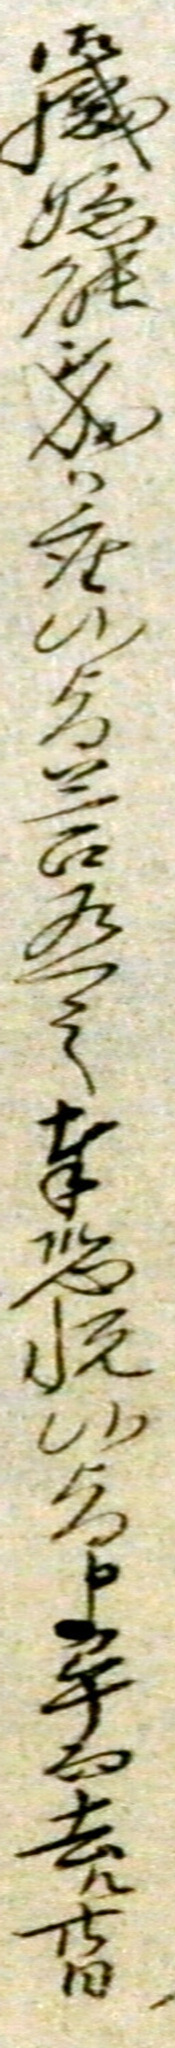御機嫌能ヒ成ご座候旨答有之奉恐悦候旨申畢而去廿日
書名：日光御名代相勤候節ノ留
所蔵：伊那市立高遠町図書館・合同会社AMANE
